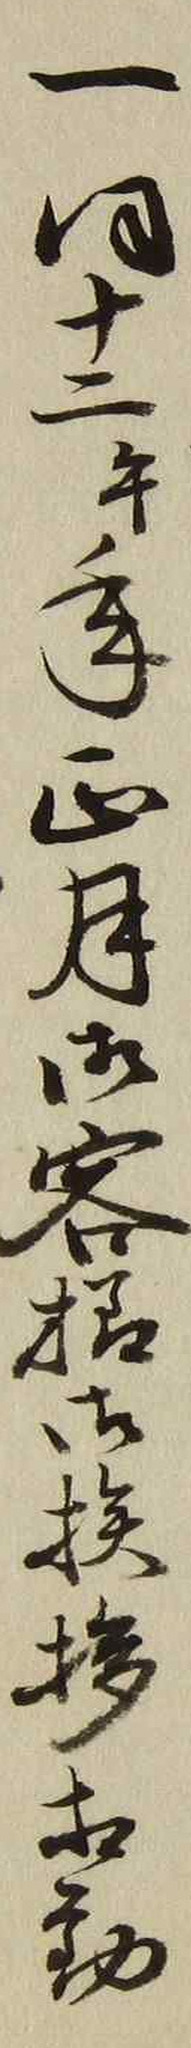一同十二午年正月御客様御挨拶相勤
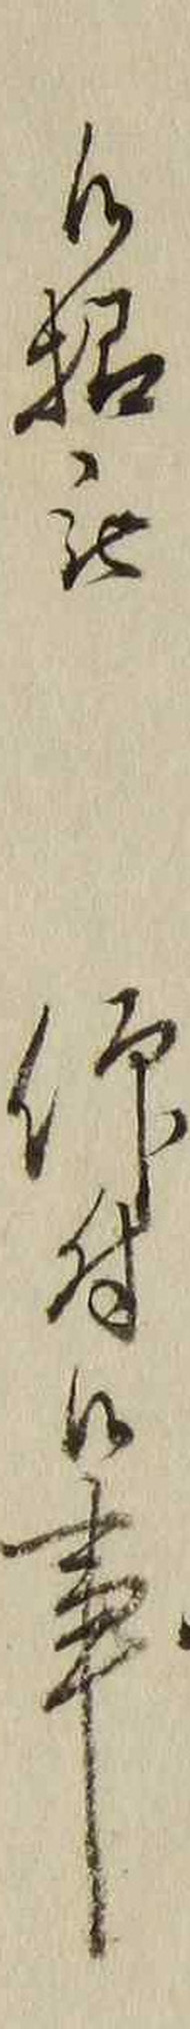候様被仰付候事
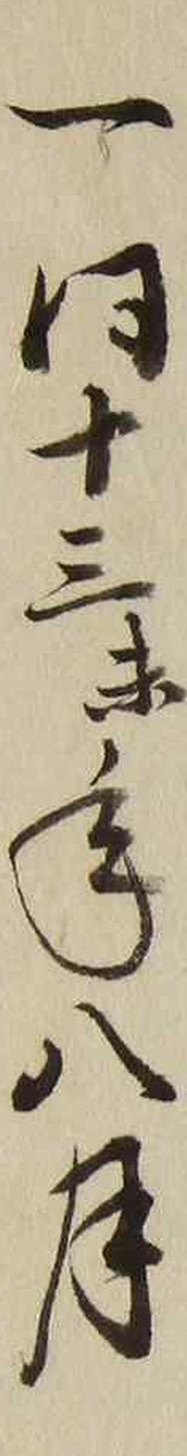一同十三未年八月

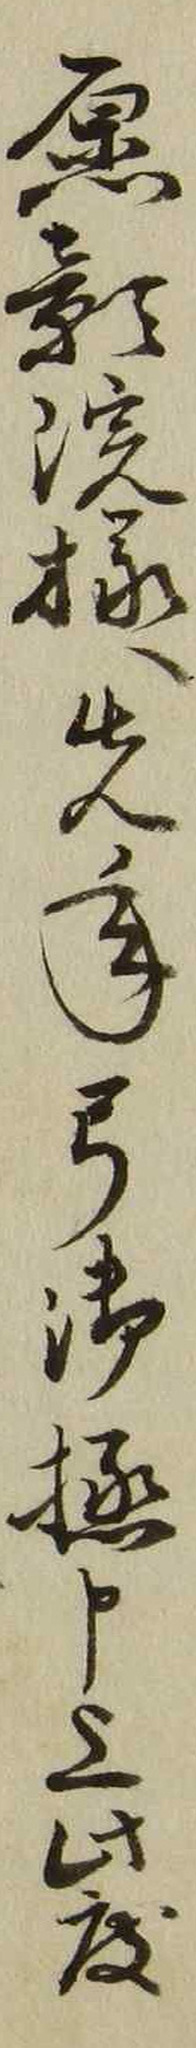愿彰院様へ先年弓御極申上此度
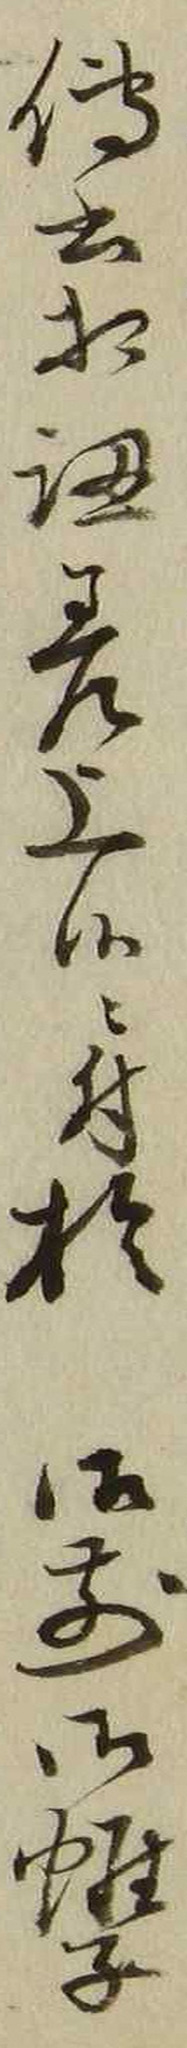伝書相認差上候ニ付於御前御帷子
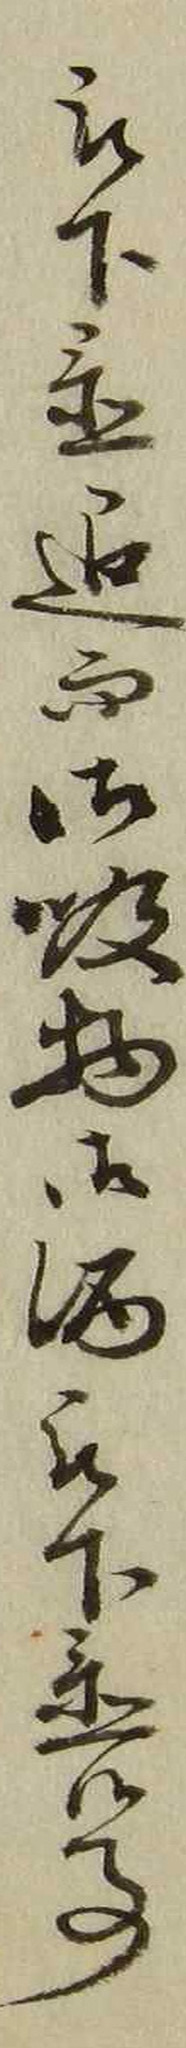被下置退而御吸物御酒被下置候事
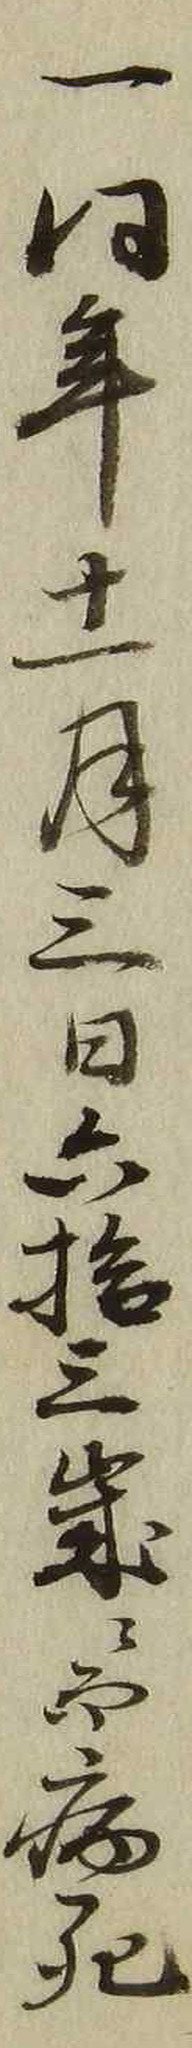一同年十一月三日六拾三歳ニ而病死
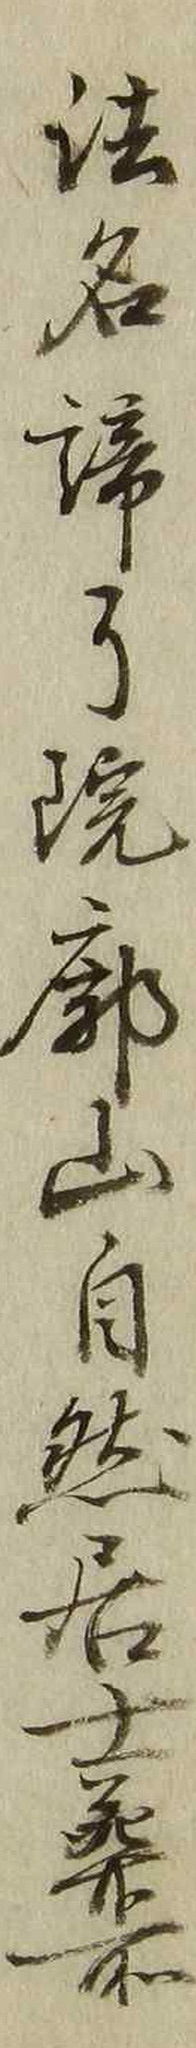法名諦了院廓山自然居士葬所
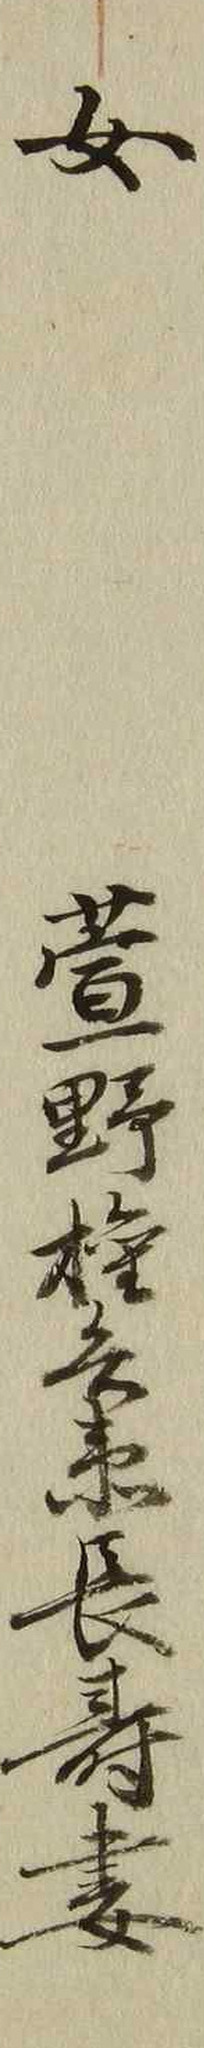女萱野権兵衛長寿妻
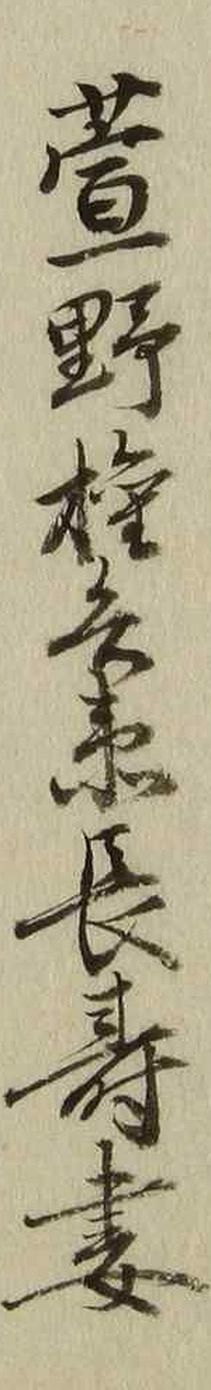女萱野権兵衛長寿妻
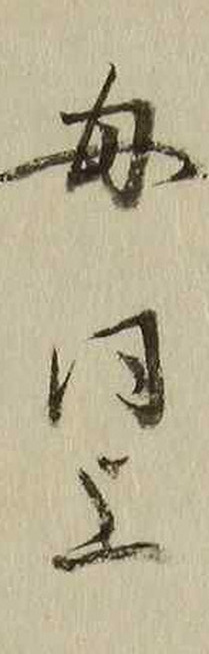母同上
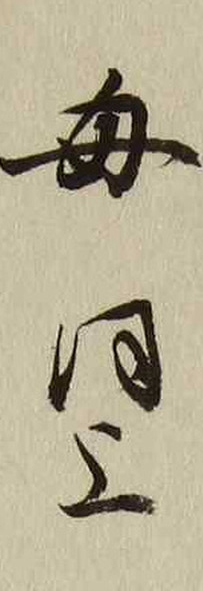母同上
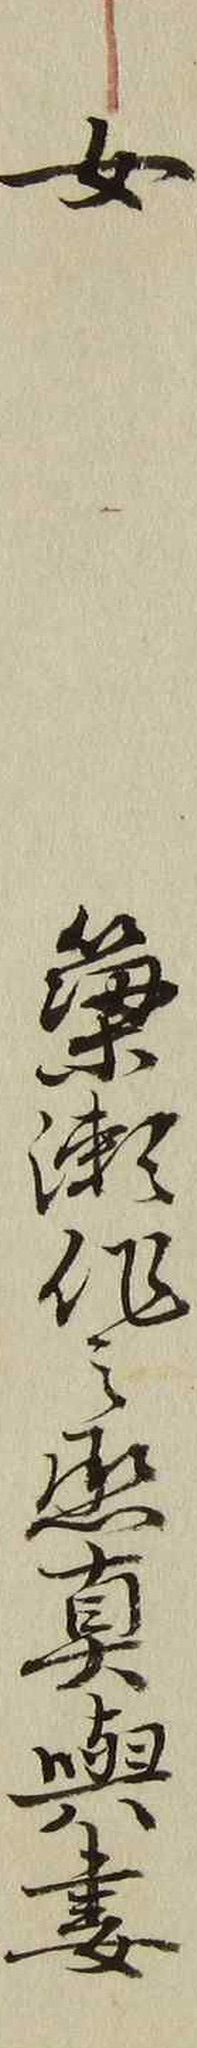女簗瀬作之丞真与妻
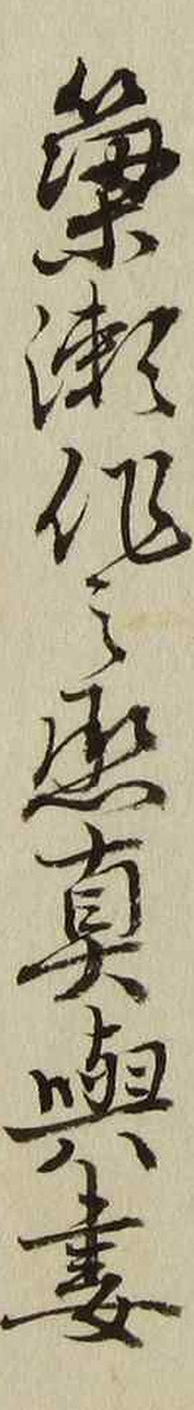女簗瀬作之丞真与妻
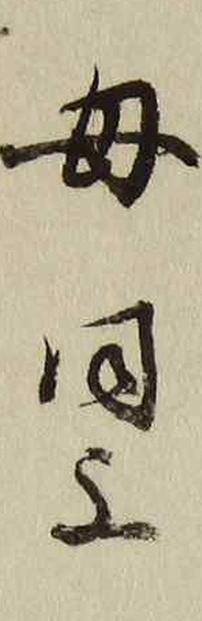母同上

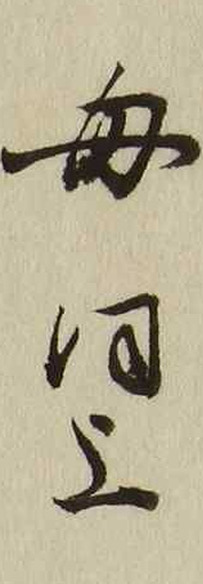母同上
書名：諸士系譜　巻之35　は之部3
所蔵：会津若松市立会津図書館
